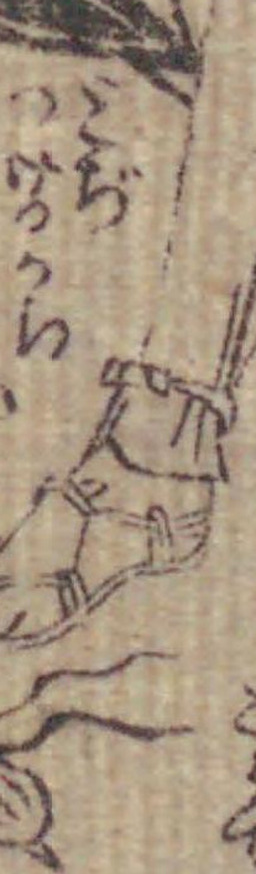つけるから
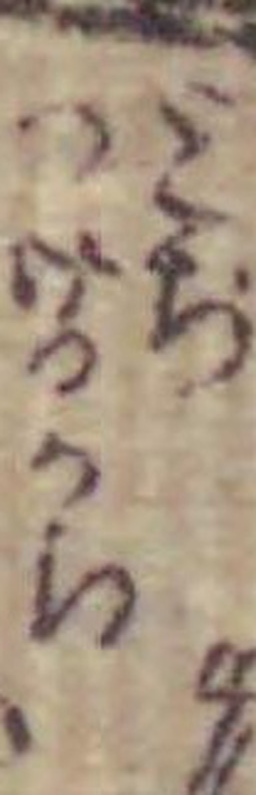つけるから
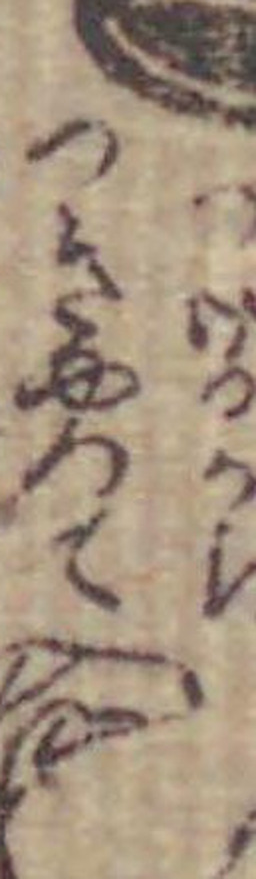つきやつて
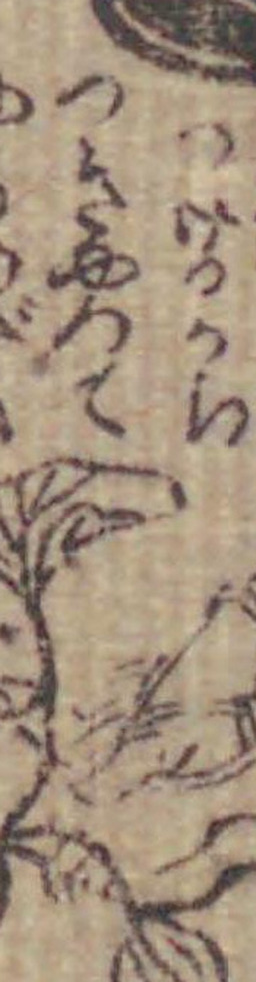つきやつて
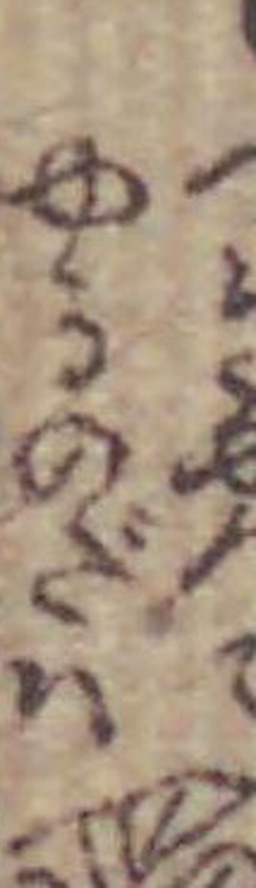やるのだは
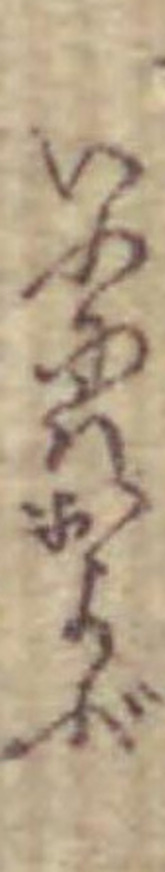いふにはおよぶ
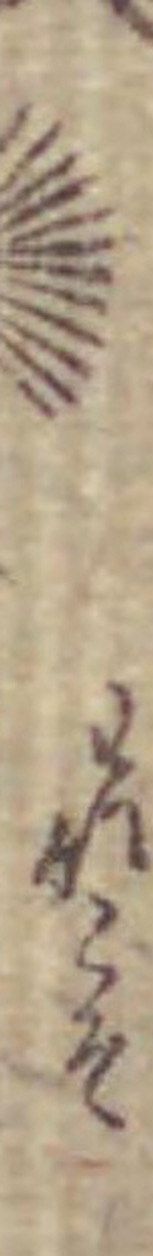われこそ
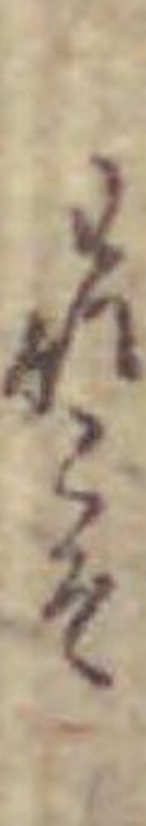われこそ
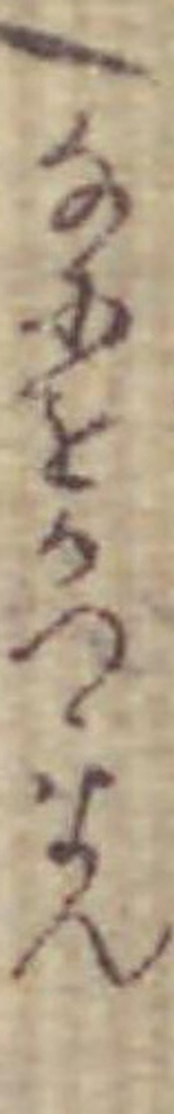なにをかつゝまん
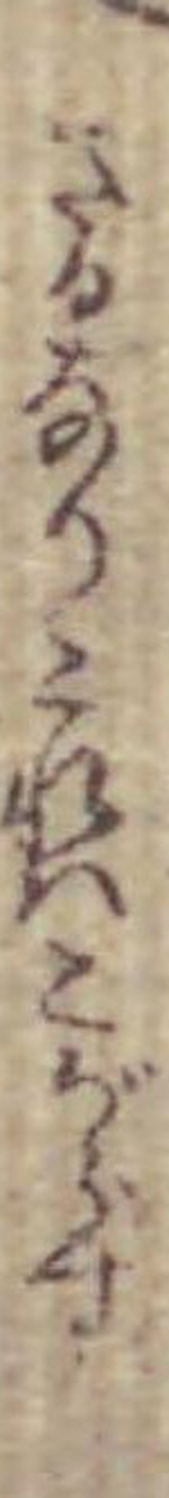さるなりこれはこがらす
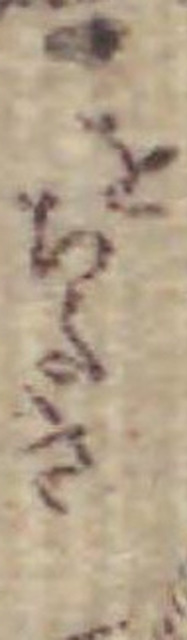をちよき
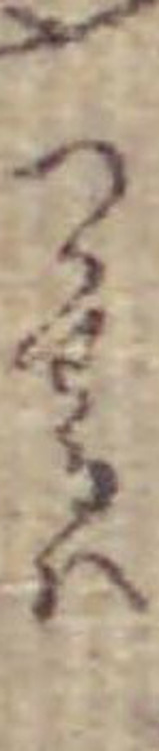つかせるは
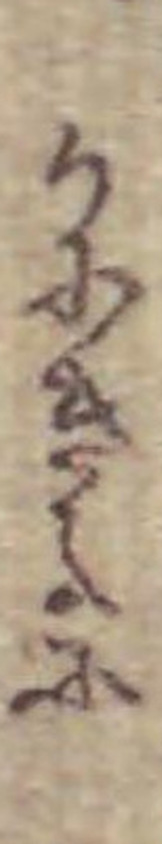かにきよに
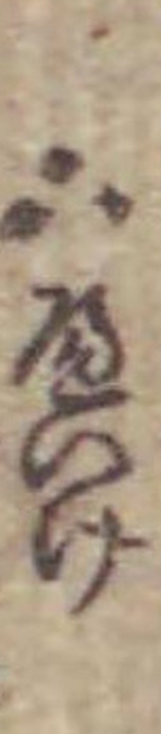道いけ
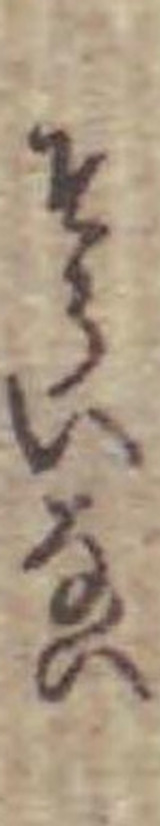そういない
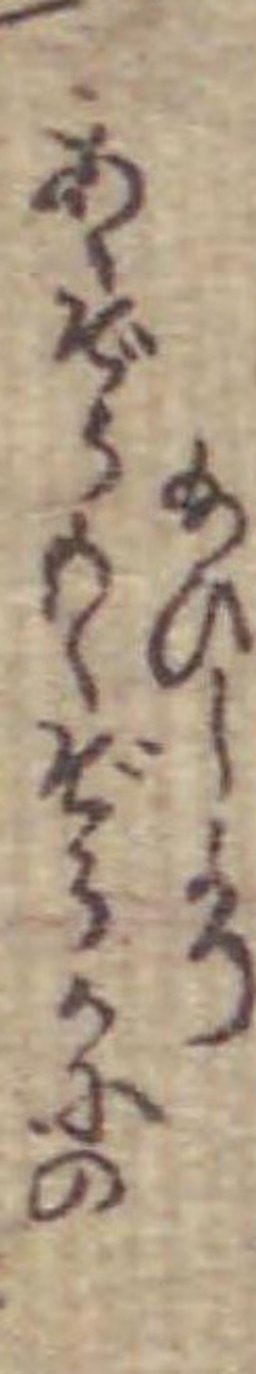あくぞうもくぞうかにの
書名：交古勢昔咄 : 2巻
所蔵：国立国会図書館 National Diet Library, JAPAN
